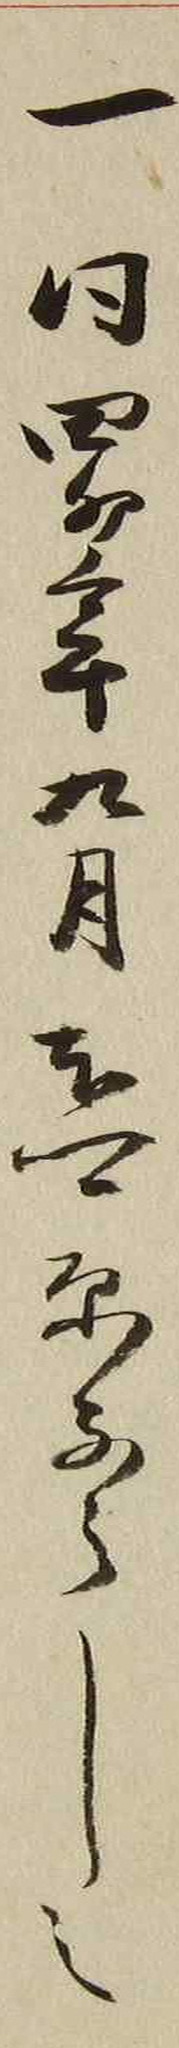一同四卯年九月本郷原ならし之
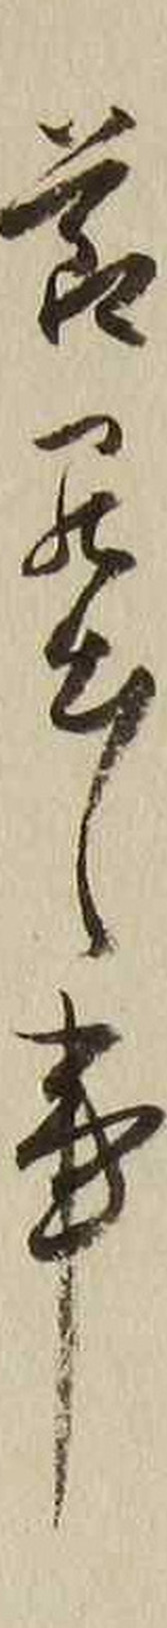節罷出候事
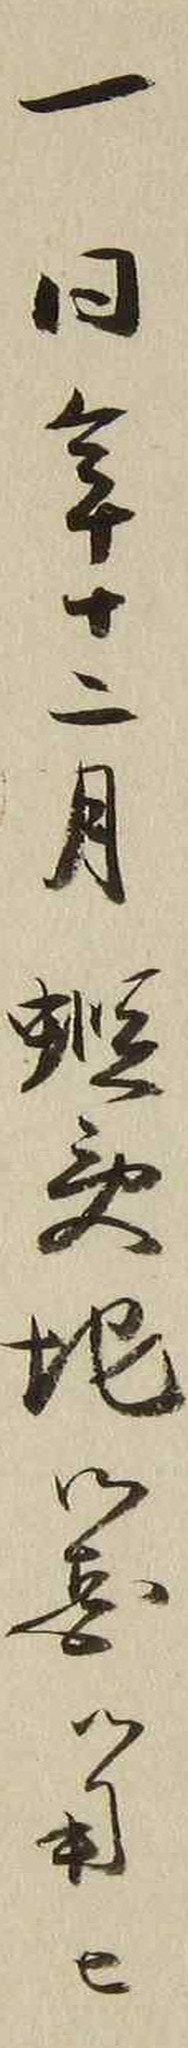一同年十二月蝦夷地御固御用被
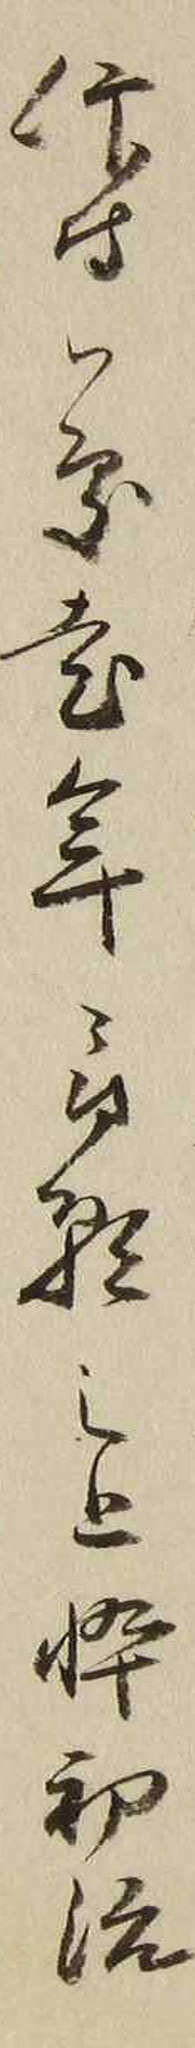仰付候処老年ニ付願之上忰初治
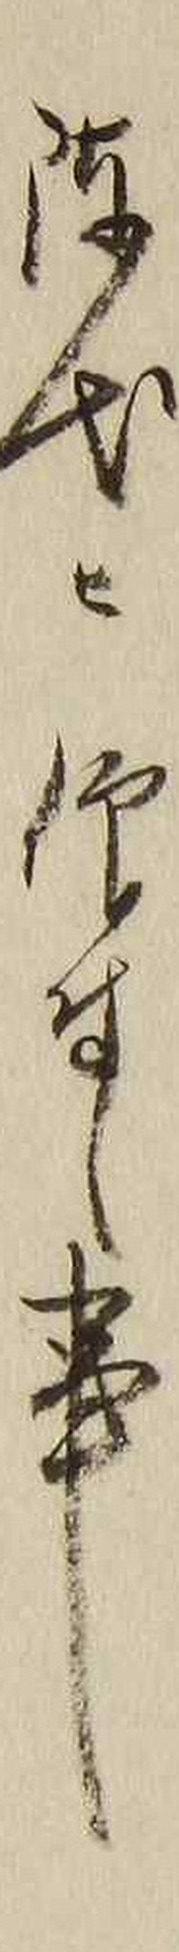陣代被仰付候事
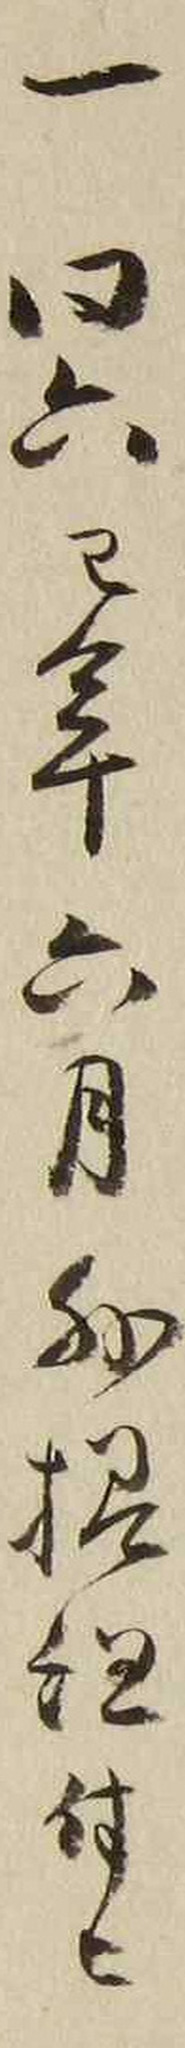一同六巳年六月外様組付被
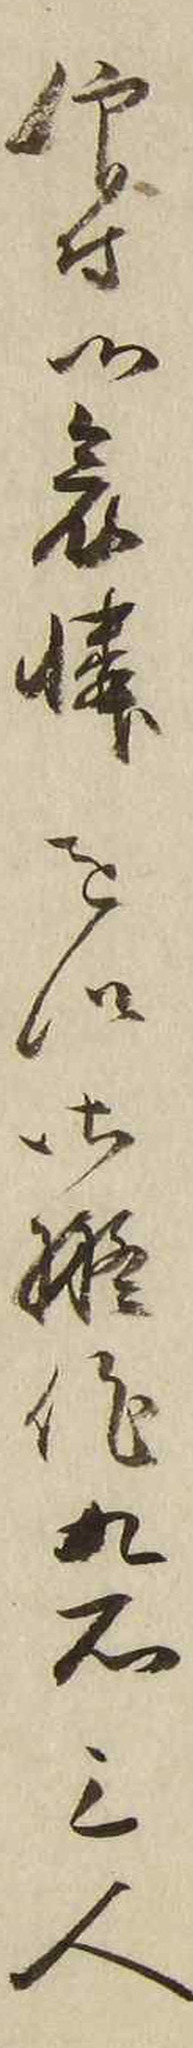仰付御哀憐を以御擬作九石三人

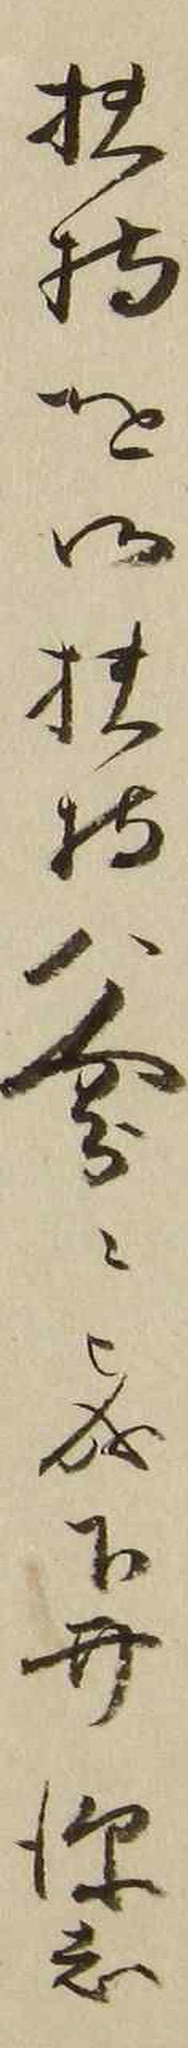扶持を御扶持八人分ニ被成下井深志
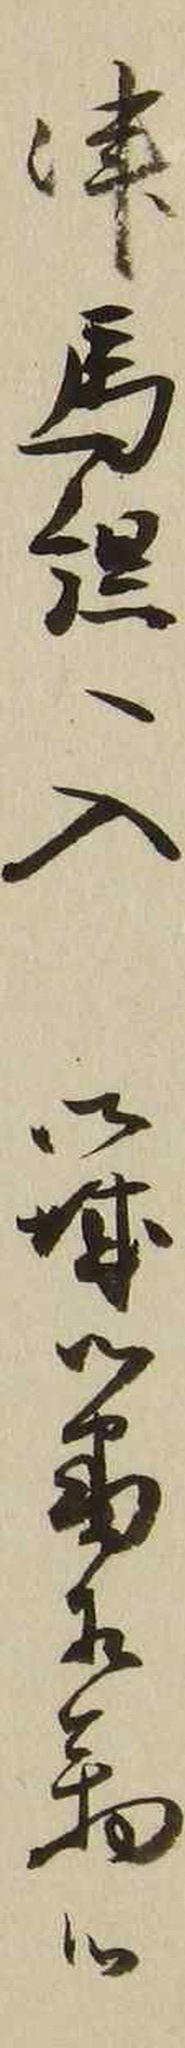津馬組へ入御城御番相勤候
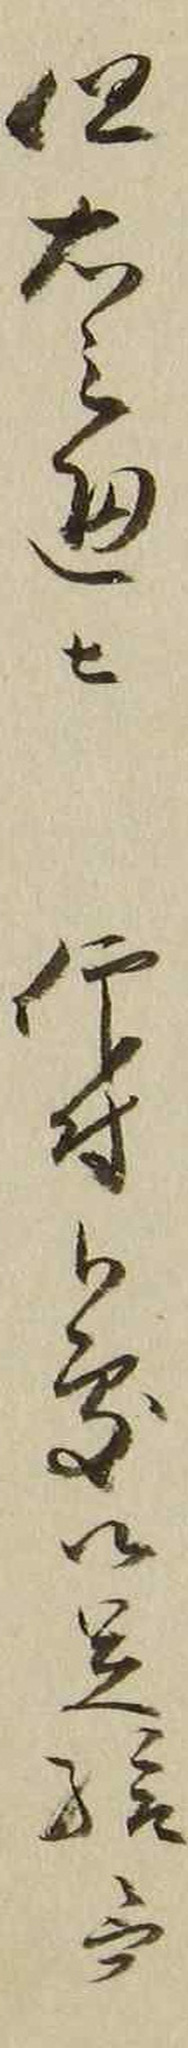但右之通被仰付候処御足給ニ而
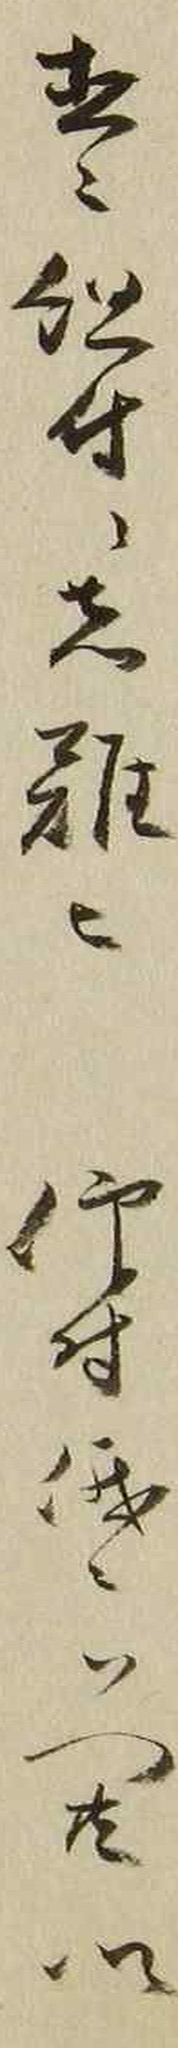直ニ組付ノ者難被仰付儀ニ候へ共以
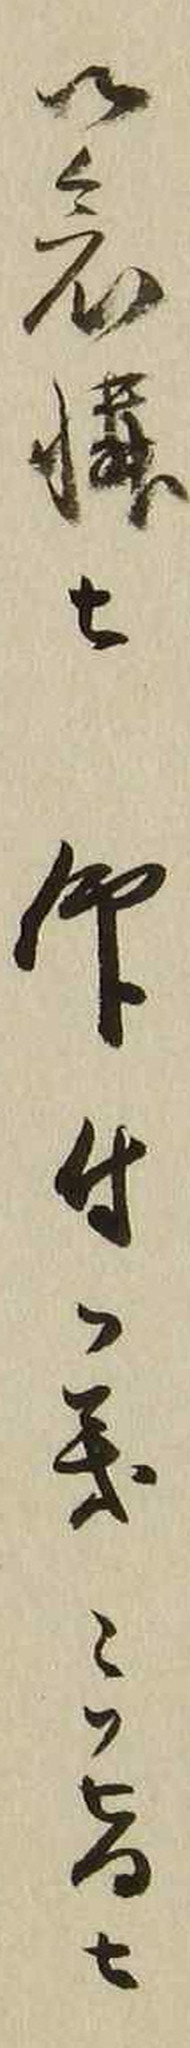御哀憐被仰付候義ニ候旨被
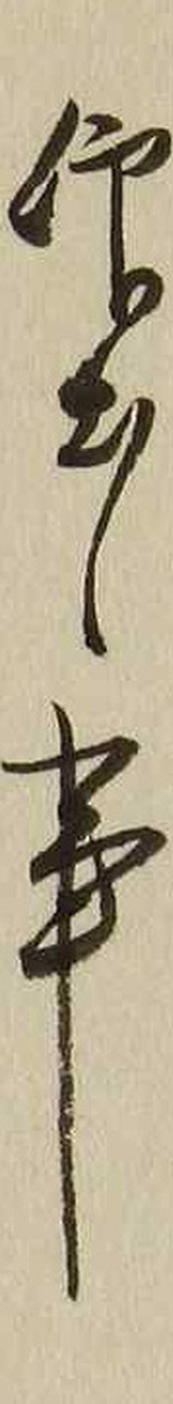仰出候事
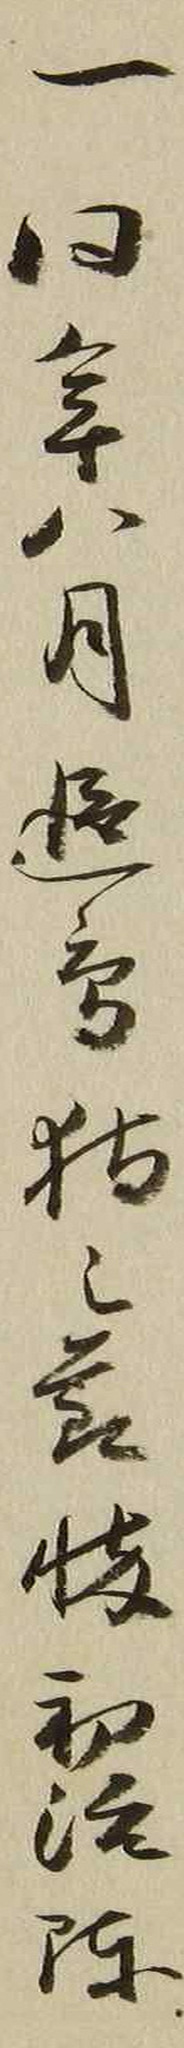一同年八月追鳥狩之節忰初治陣
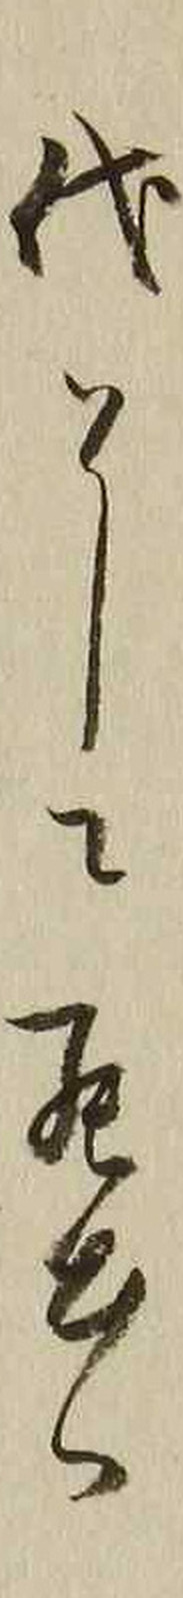代として罷出候
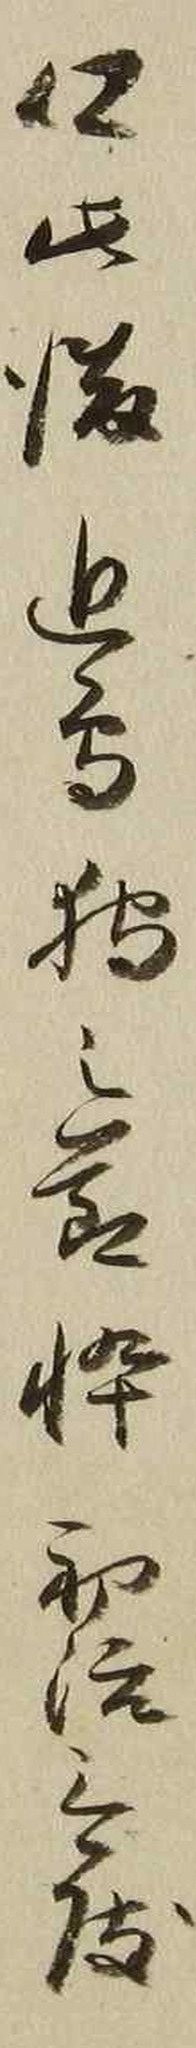但此後追鳥狩之節忰初治三度
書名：諸士系譜　巻之288　さ之部20
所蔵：会津若松市立会津図書館
